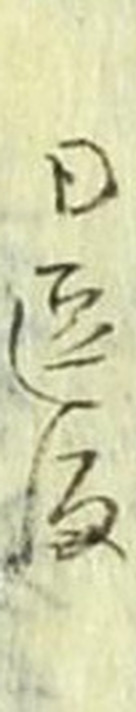同逗留
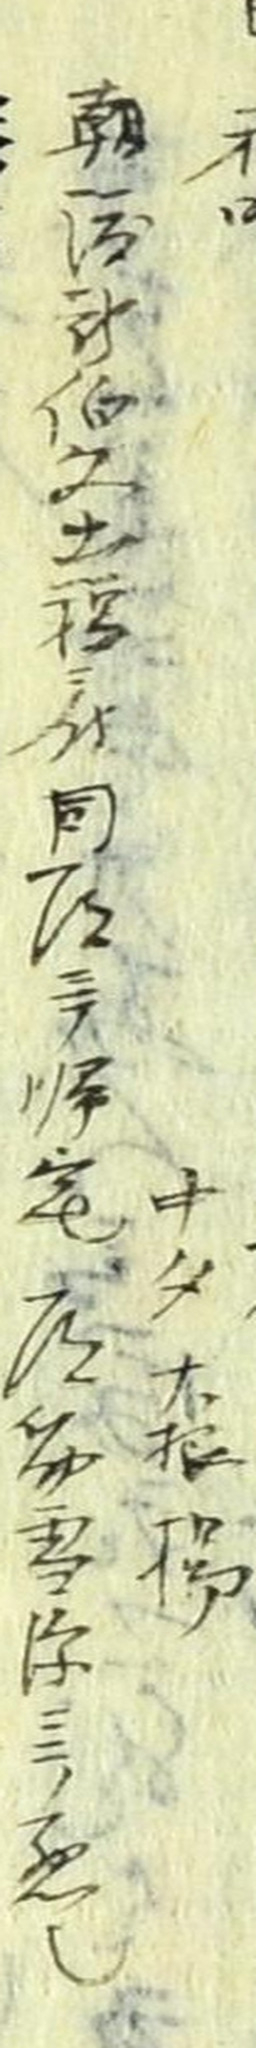朝渡部伯父出福ニ付同道ニテ帰宅道筋雪深ニテ悪シ
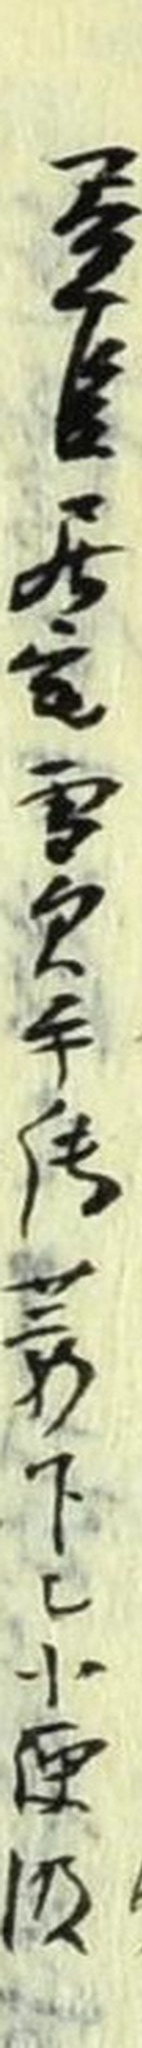昼後居宅雪欠手伝薪下シ小便汲
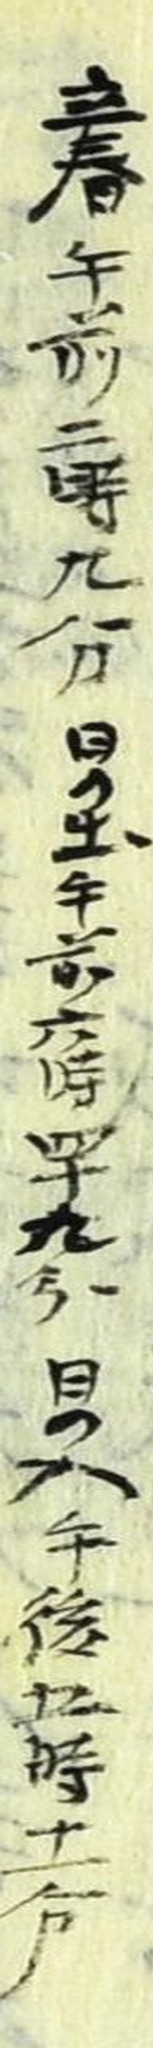立春午前二時九分日の出午前六時四十九分日の入午後五時十一分
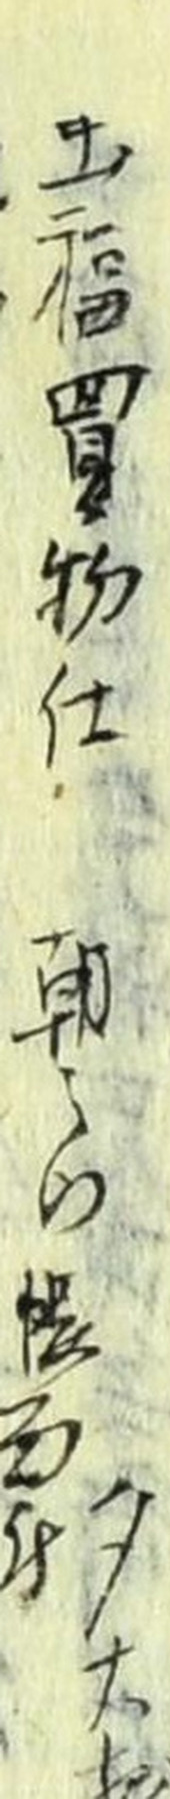出福買物仕朝之内帳面付
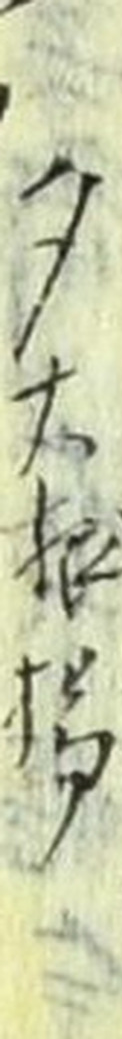夕大根揚
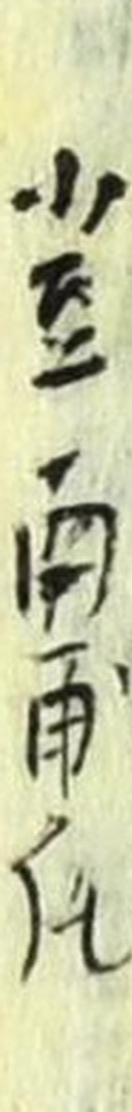小豆南甫瓜
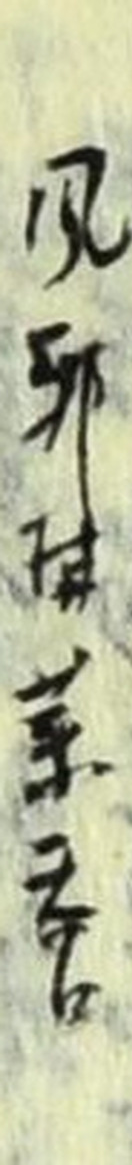風邪払薬呑
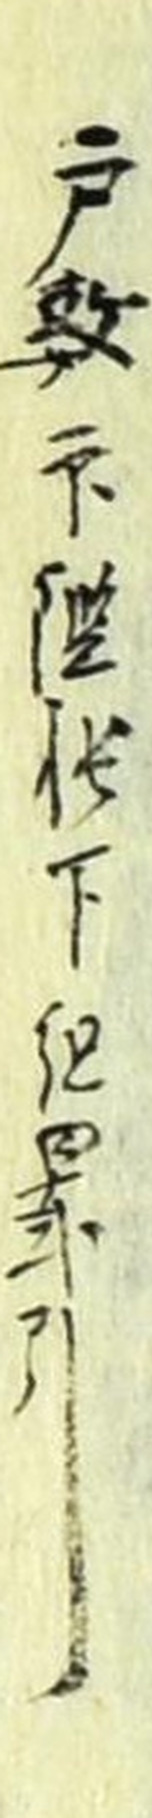戸数印鑑帳下組罫引
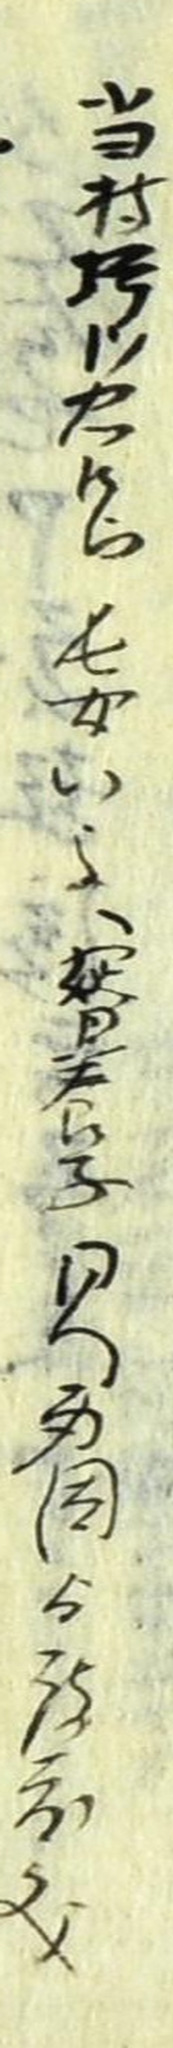当村坪川忠左衛門長女いよへ婿養子同人身固与致度義
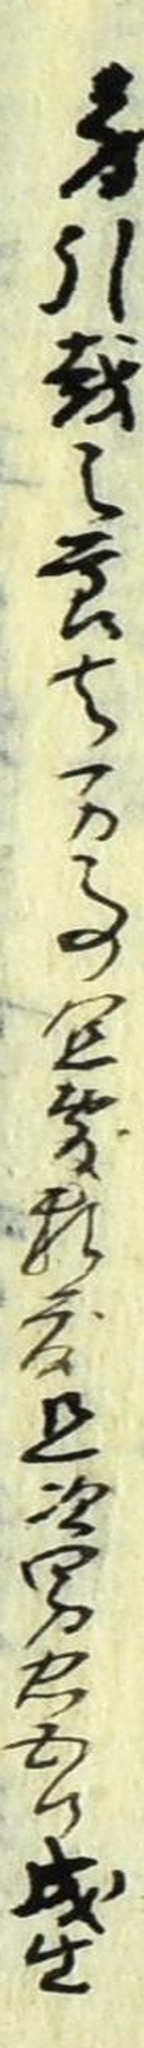ニ付引越之節者万事宜敷頼度且次男忠五郎成生
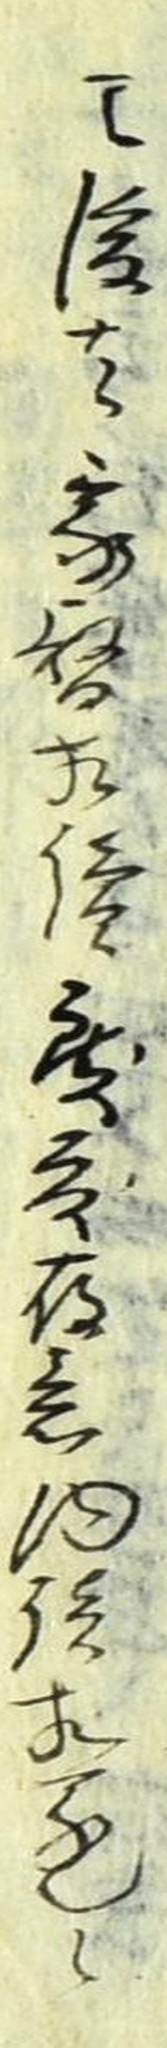已後者家督相続致度存意内談相遂候

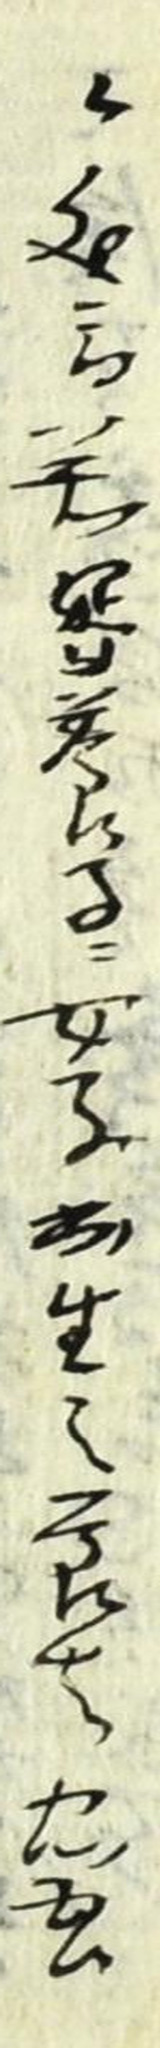候処ニ而若聟養子ニ女子出生之節者忠五郎
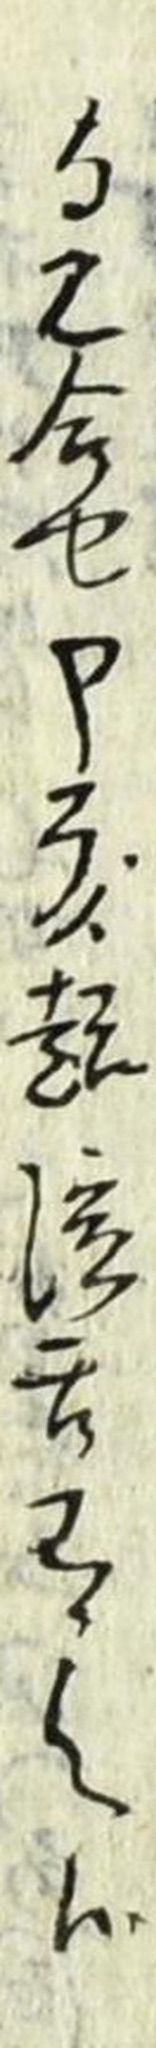与見合セ申度趣演舌有之候
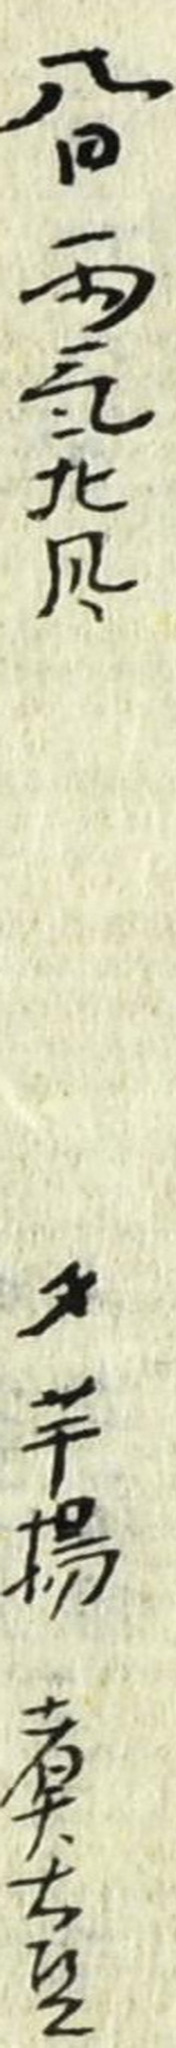八日雨気北風夕芋揚煮大豆
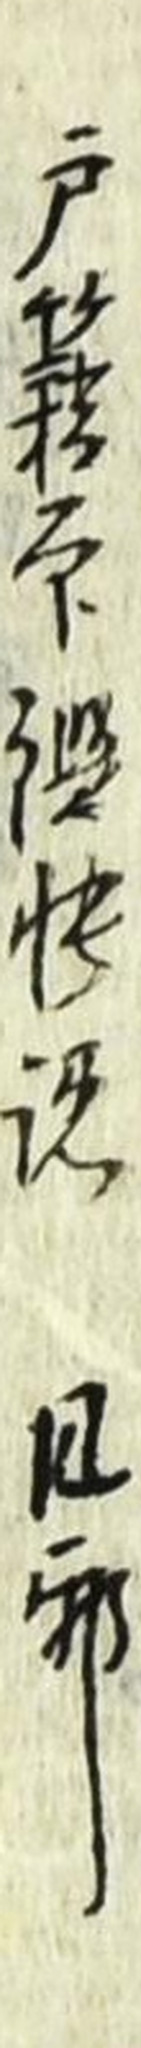戸籍印鑑帳認風邪
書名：（日記）
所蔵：福井県文書館 Fukui Prefectural Archives
